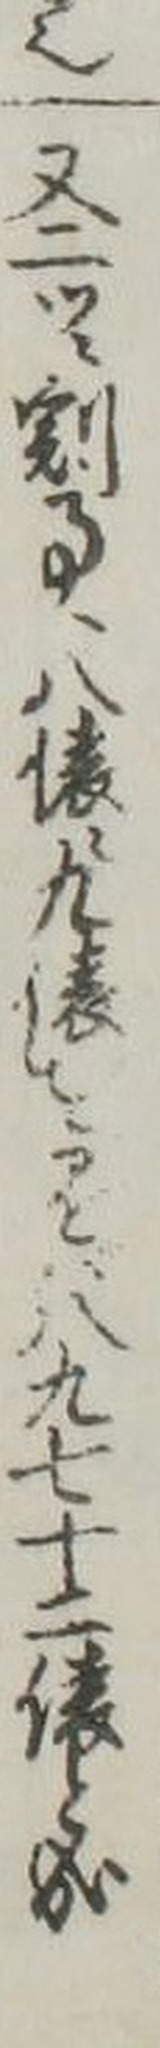又二ツに割事は八俵に九俵を懸ば八九七十二俵と成
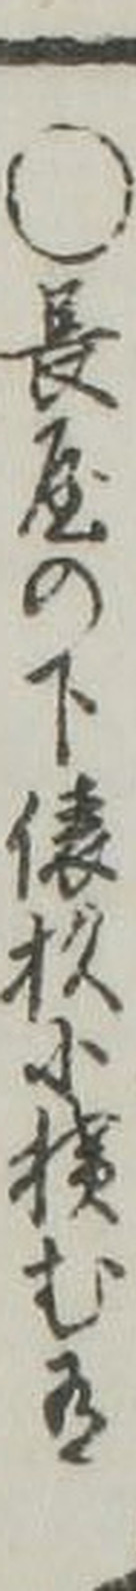○長屋の下俵杉に積む有
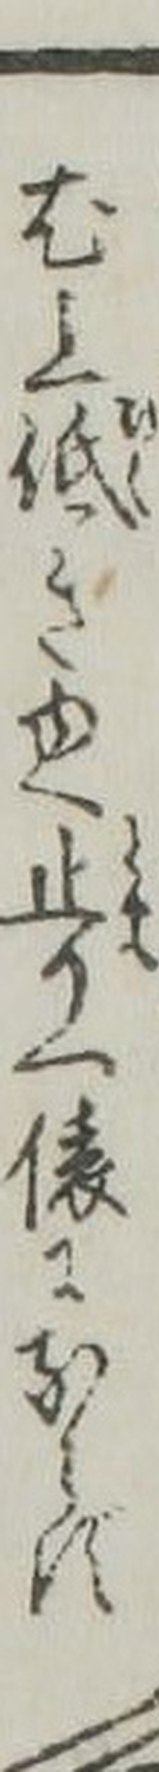尤上低きゆへ止り一俵にならず
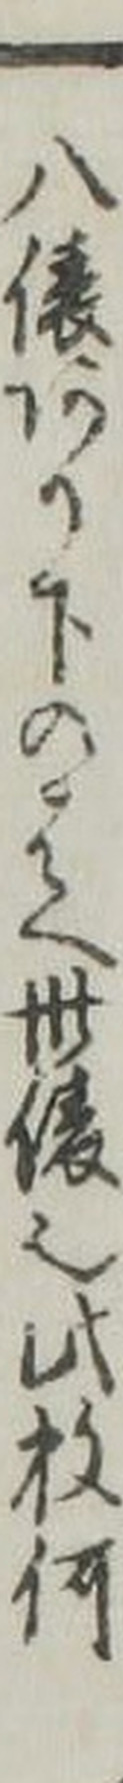八俵あり下のはへ卅俵也此杉何
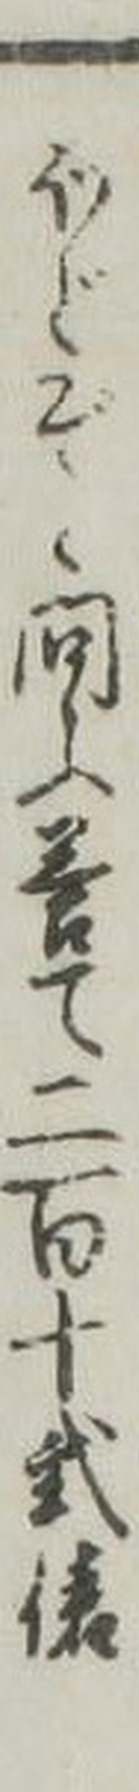ほどぞと問ふ答て二百十弐俵
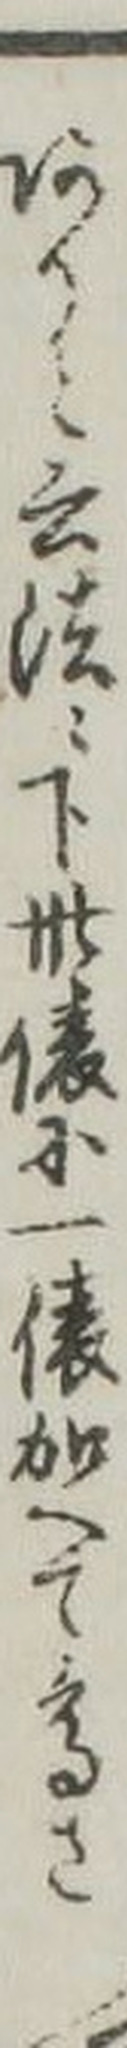ありと云法に下卅俵に一俵加へて高さ
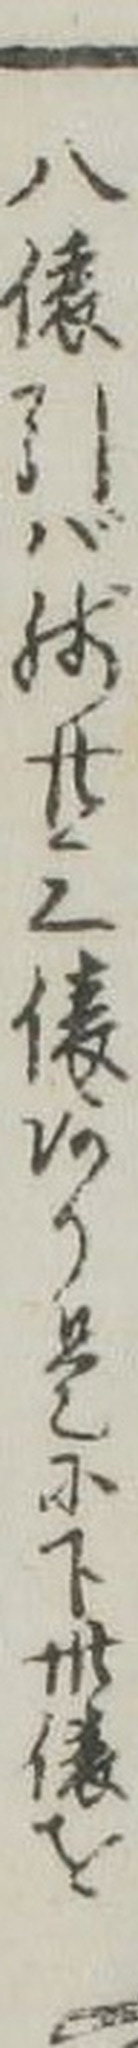八俵引ば残廿三俵あり是に下卅俵を
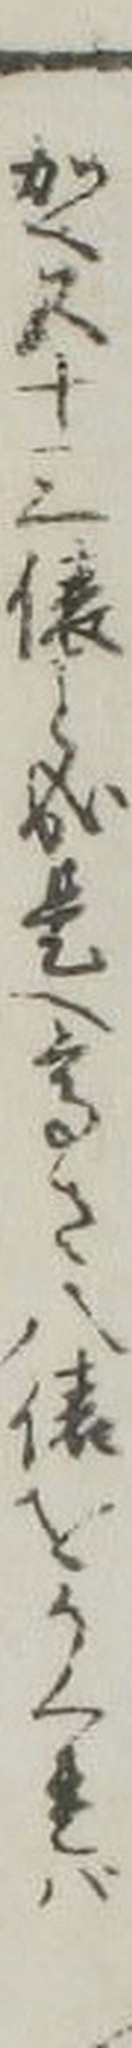加へ五十三俵と成是へ高さ八俵をかくれば
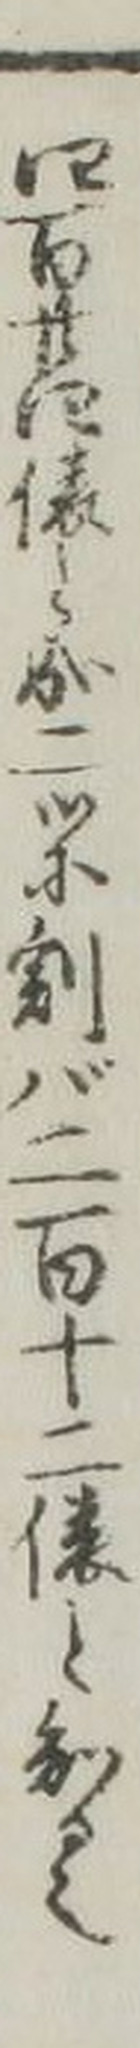四百廿四俵と成二ツに割ば二百十二俵と知る也
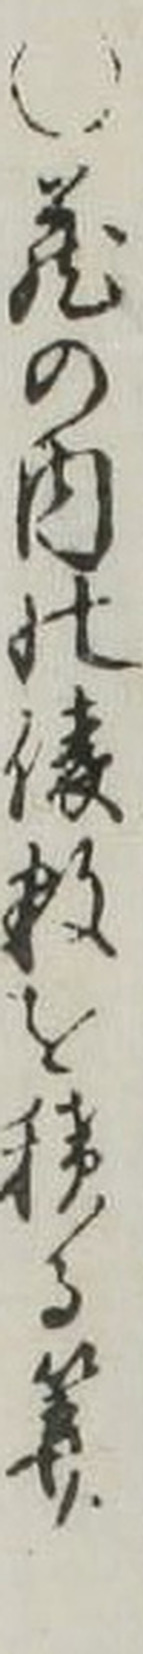○蔵の内の俵数を積る算
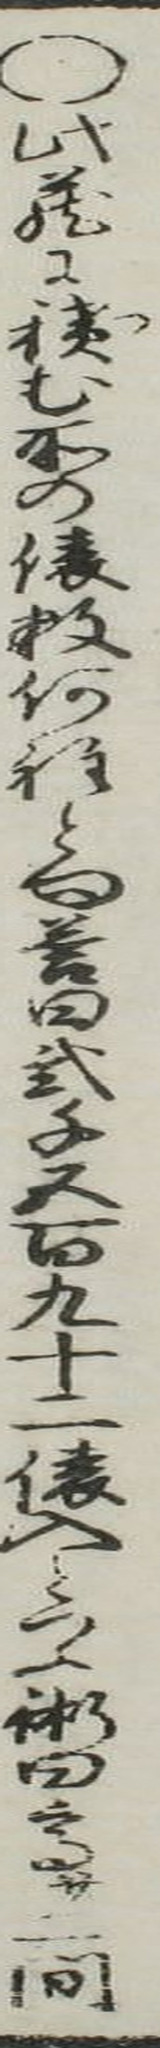○此蔵に積む所の俵数何程と問答曰弐千五百九十二俵入といふ術曰高サ二間
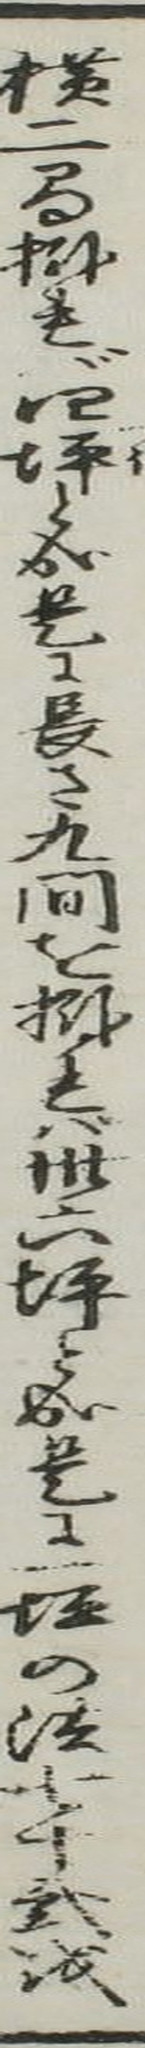横二間掛れば四坪と成是に長さ九間を掛れば卅十六坪と成是に一坪の法七十弐を
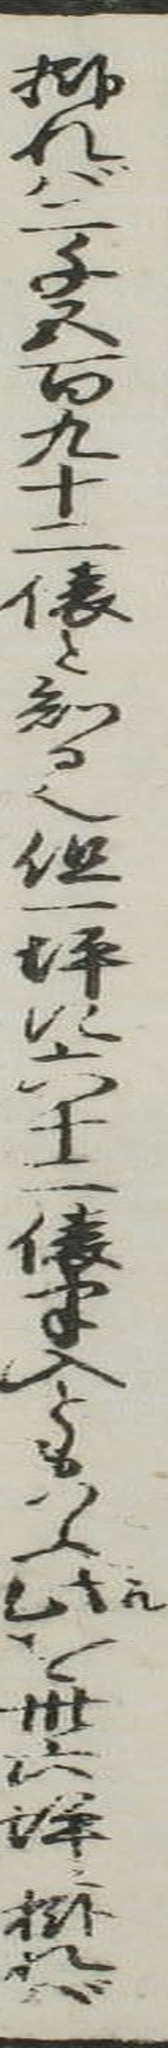掛れば二千五百九十二俵と知る也但一坪に六十二俵半入ともいふ此を卅六坪に掛れば
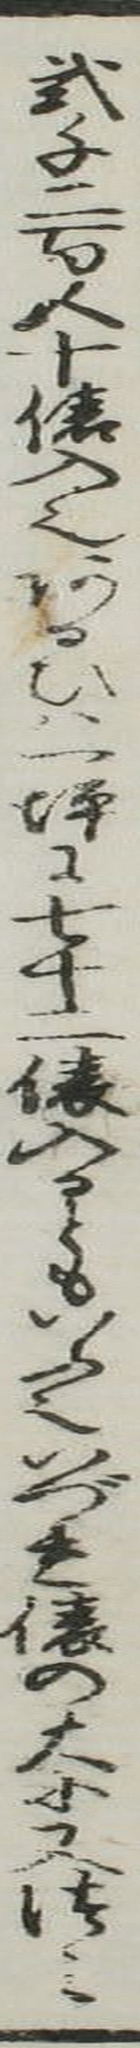弐千二百五十俵入也あるひは一坪に七十二俵入るともいふ也いづれ俵の大小又つみ
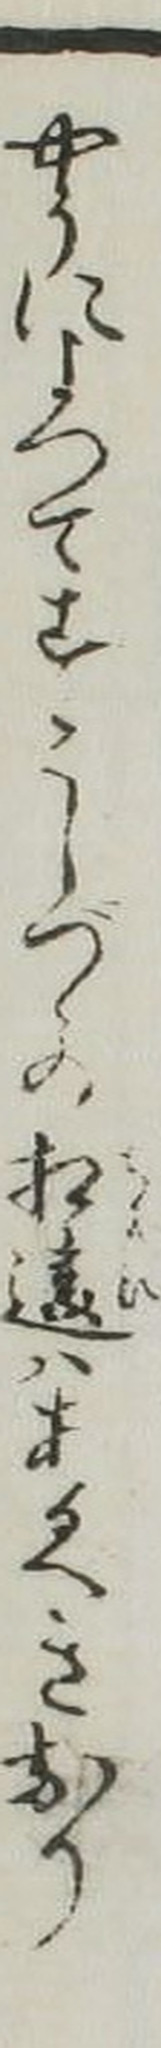やうによつてすこしづゝの相違はあるへきなり
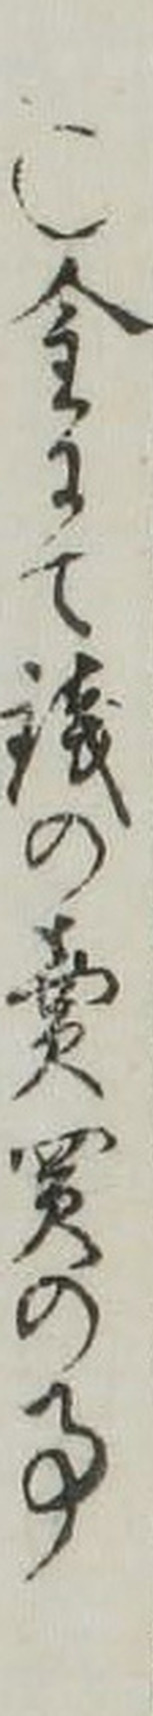○金にて銭の売買の事
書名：宝玉塵劫記
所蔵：東京学芸大学教育コンテンツアーカイブ
